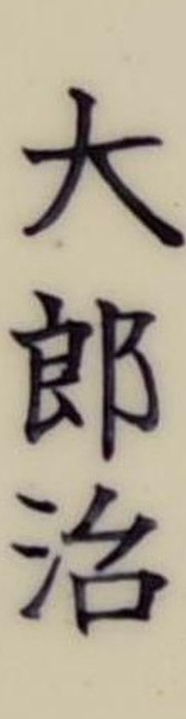大郎治
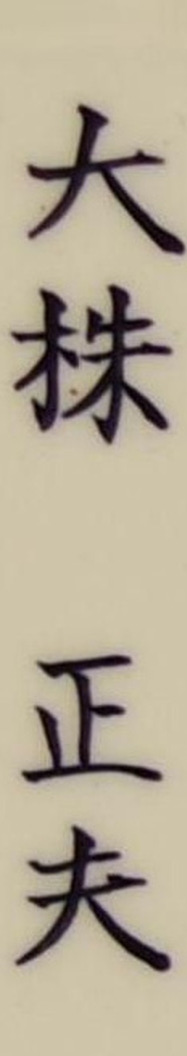大株正夫
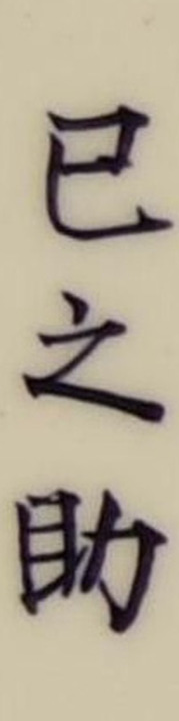巳之助
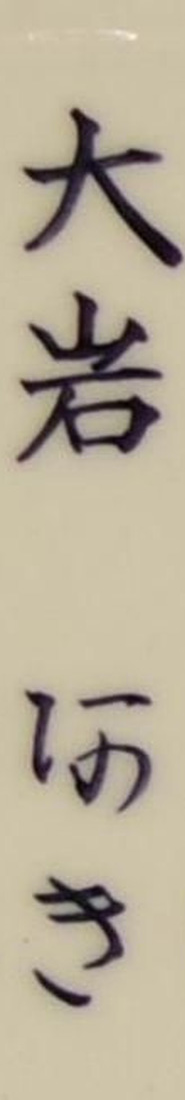大岩あき

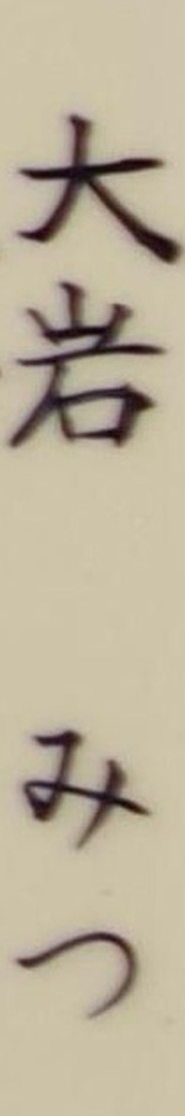大岩みつ
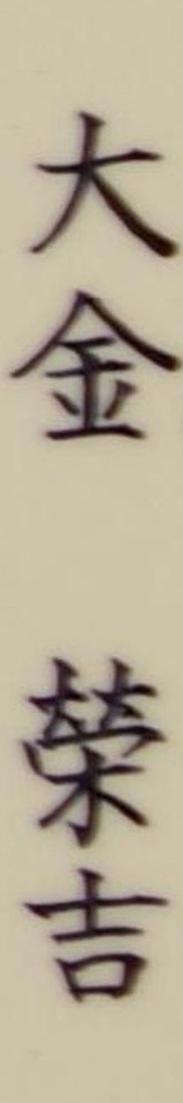大金榮吉
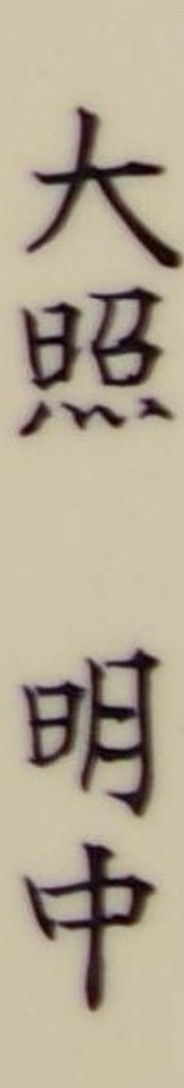大照明中
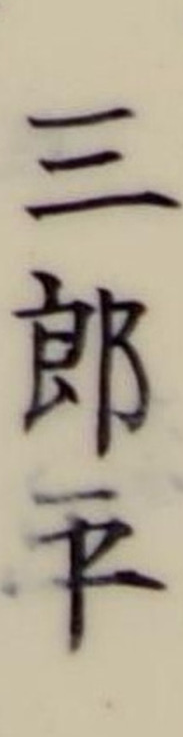三郎平
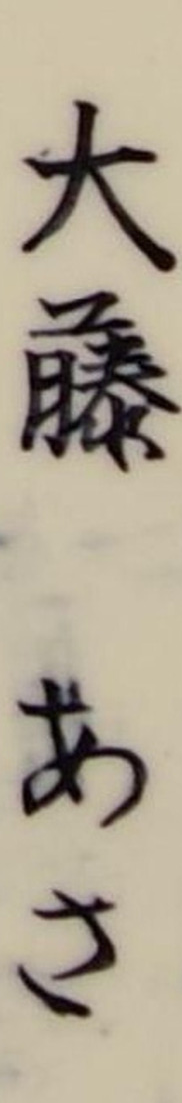大藤あさ
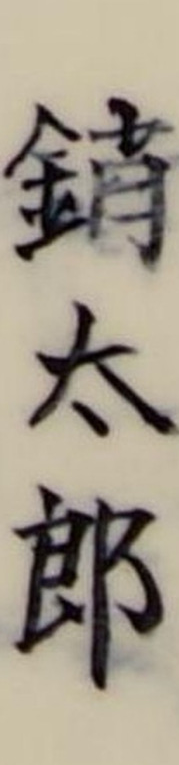銷太郎
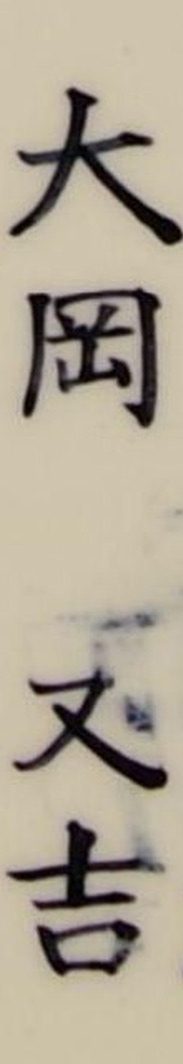大岡又吉
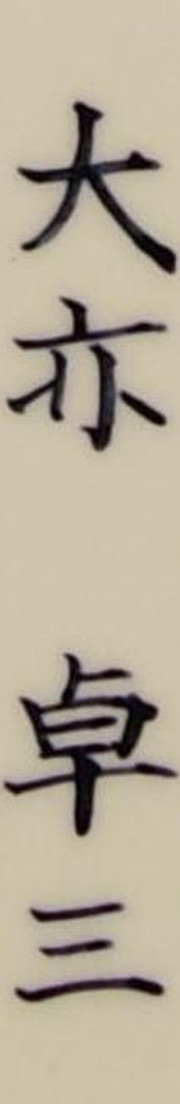大亦卓三
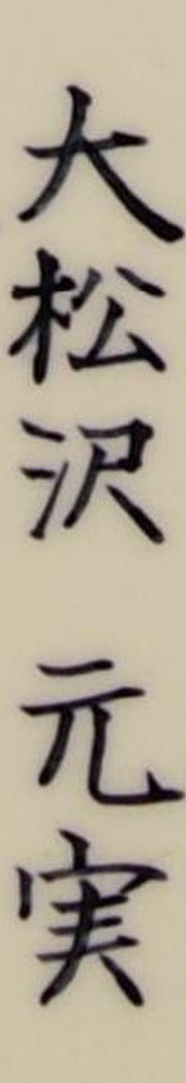大松沢元実
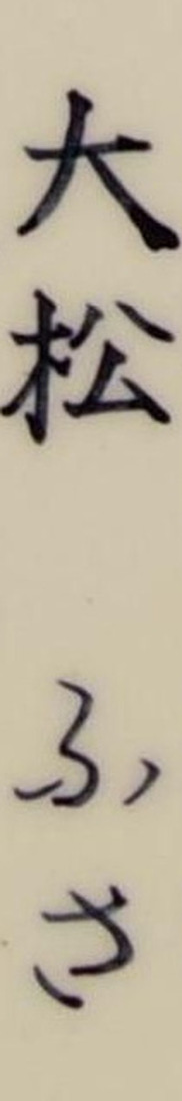大松ふさ
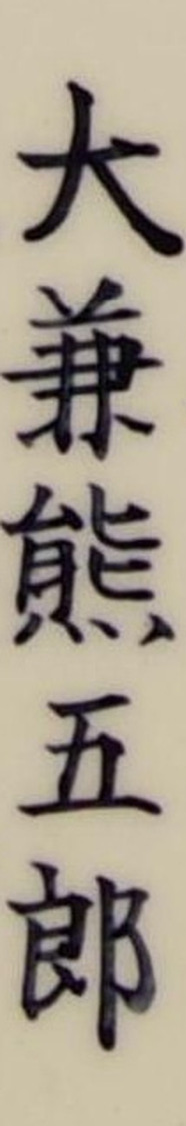大兼熊五郎
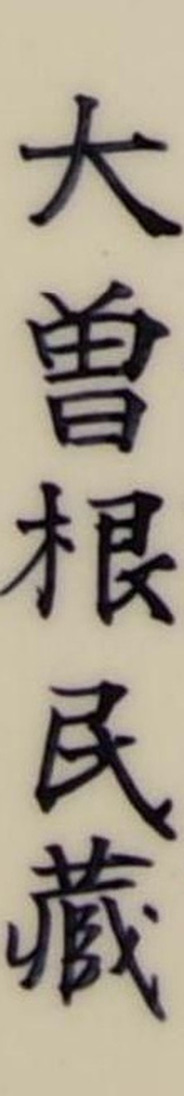大曽根民蔵
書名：A~D
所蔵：koyasan kongobuji
